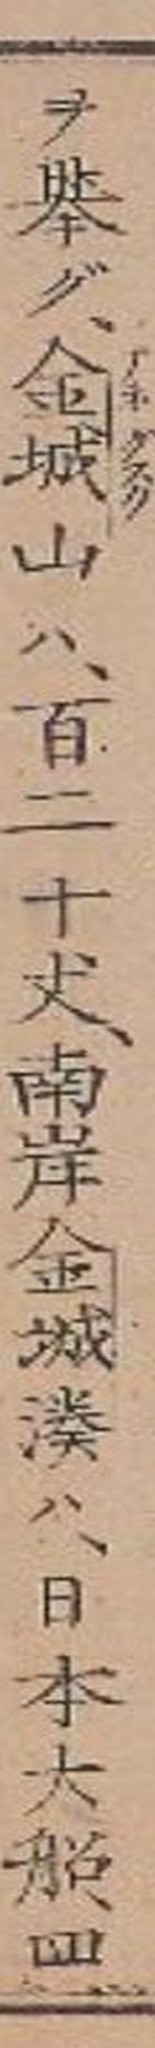ヲ挙グ、金城山ハ、百二十丈、南岸金城湊ハ、日本大船、四
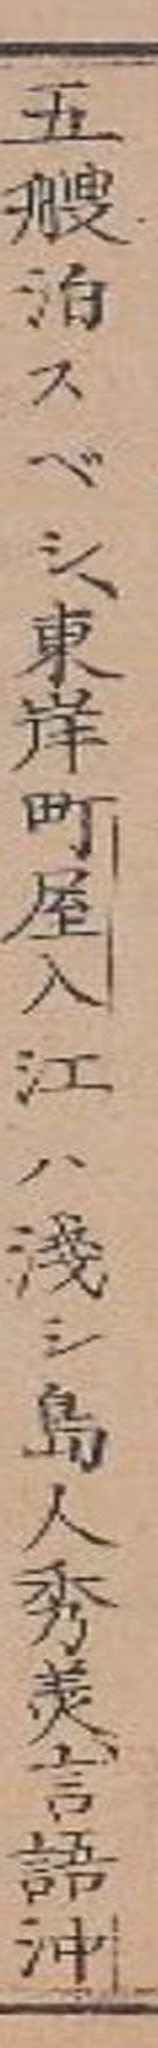五艘泊スベシ、東岸町屋入江ハ浅シ島人秀美、言語沖
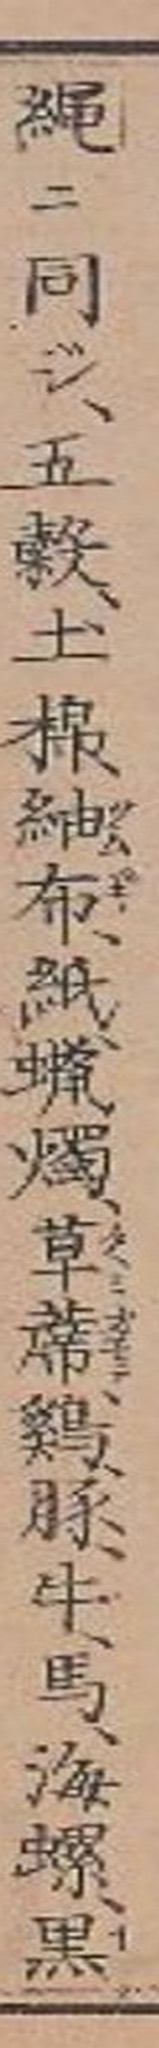縄ニ同ジ、五穀、土棉、紬布、紙、蝋燭、草蓆、鶏、豚、牛、馬、海螺、黒
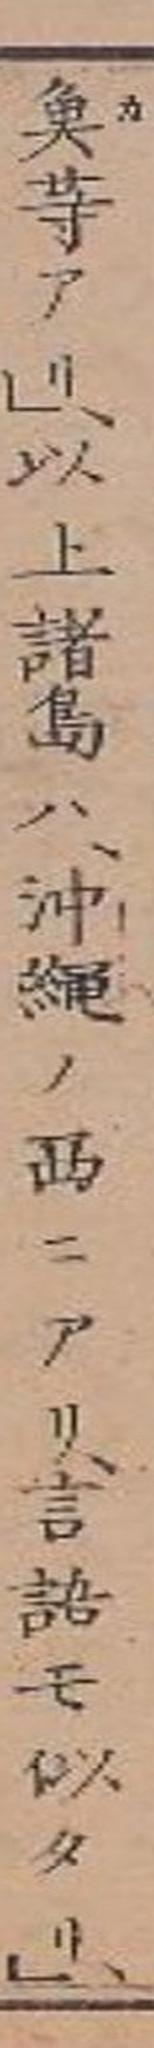魚等アリ、」以上諸島ハ、沖縄ノ西ニアリ、言語モ似タリ、」
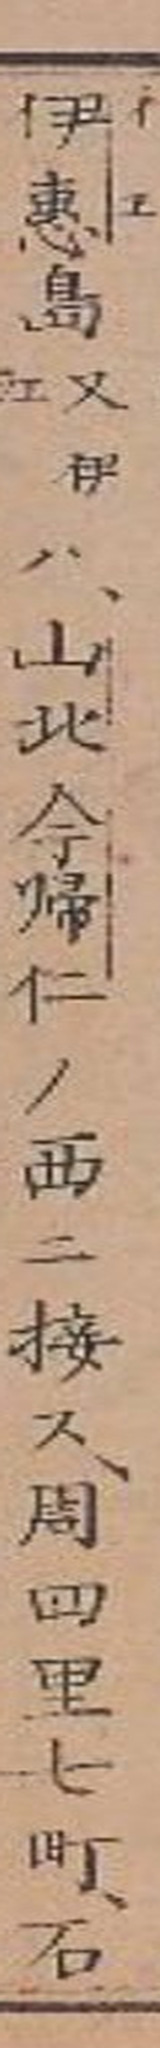伊恵島又伊江ハ、山北今帰仁ノ西ニ接ス、周四里七町、石

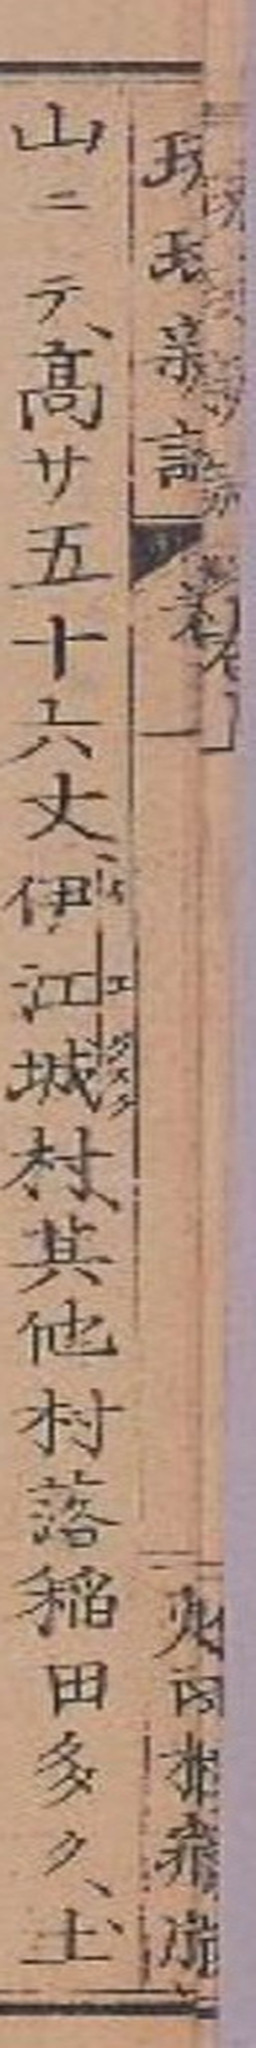山ニテ、高サ五十六丈、伊江城村、其他村落稲田多ク、土
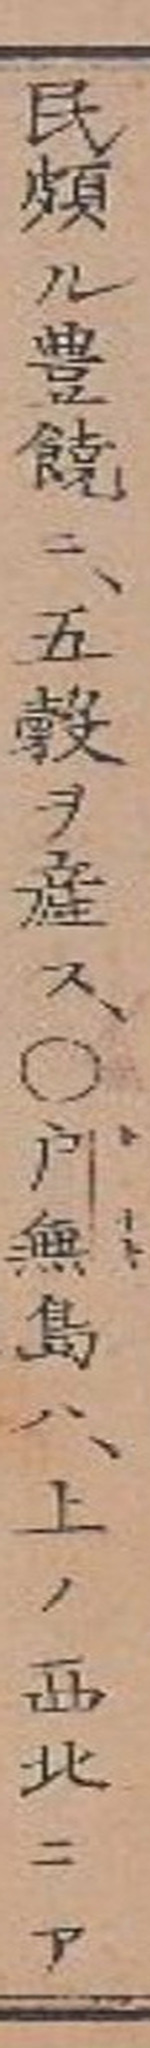民頗ル豊饒ニ、五穀ヲ産ス、○戸無島ハ、上ノ西北ニア
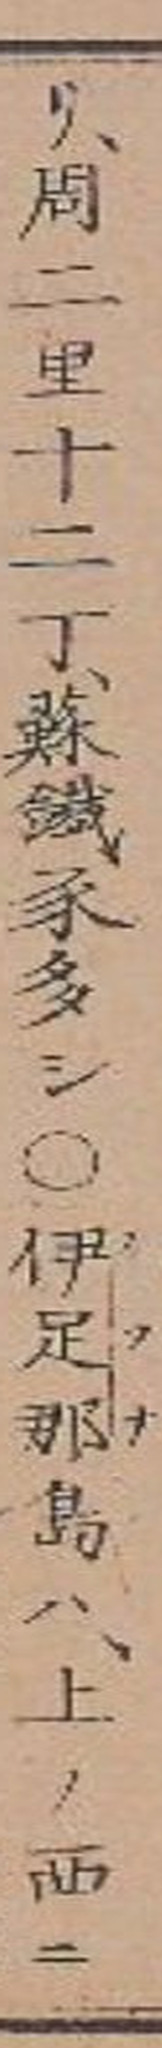リ、周二里十二丁、蘇鉄豕多シ○伊足那島ハ、上ノ西ニ
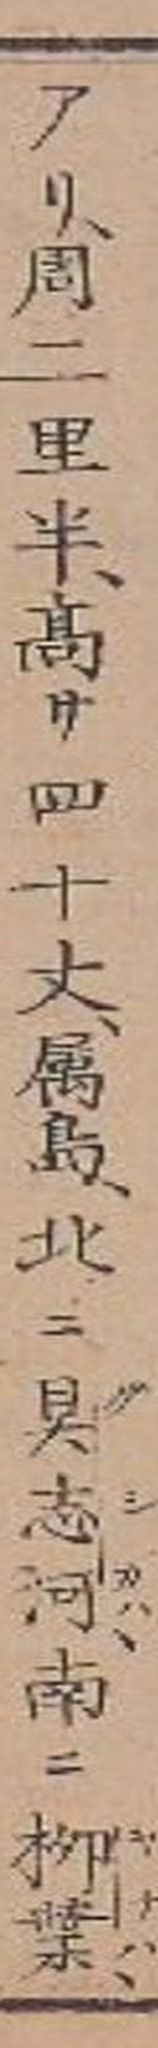アリ、周二里半、高サ四十丈、属島、北ニ具志河、南ニ柳葉、
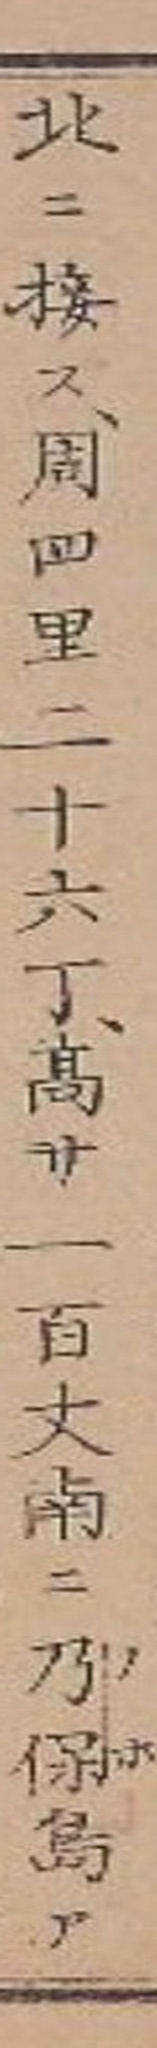北ニ接ス、周四里二十六丁、高サ一百丈南ニ乃保島ア
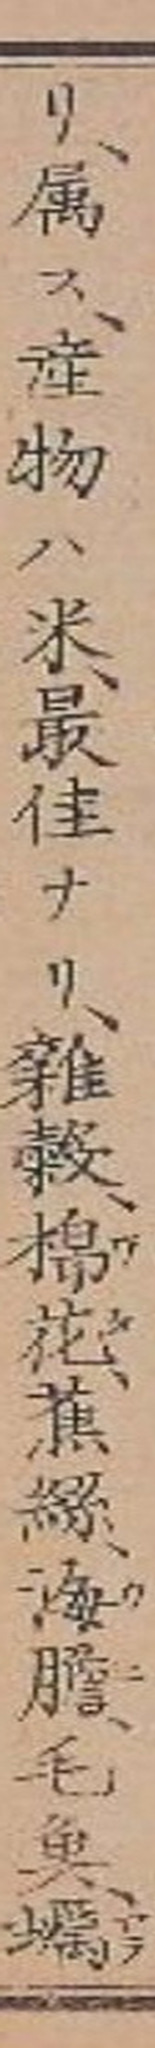リ、属ス、産物ハ米、最佳ナリ、雑穀、棉花、蕉糸、海胆、毛魚、蠣
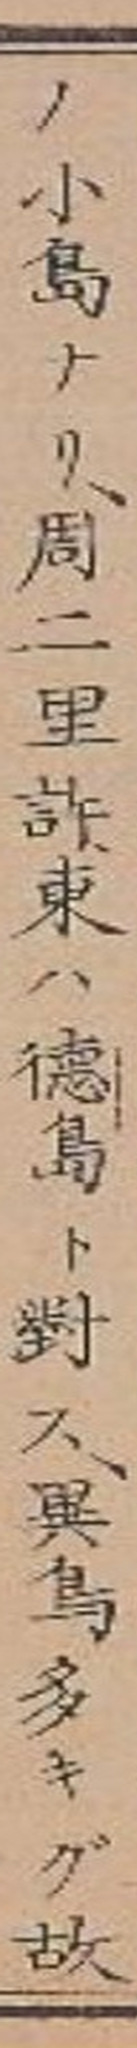ノ小島ナリ、周二里許、東ハ徳島ト対ス、異鳥多キガ故
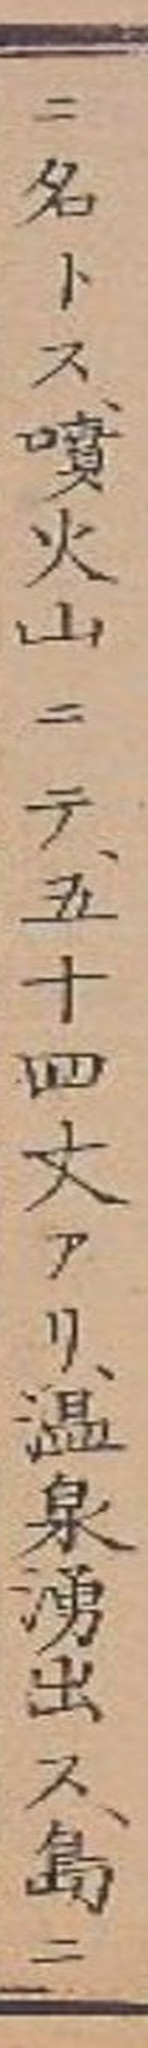ニ名トス、噴火山ニテ、五十四丈アリ、温泉湧出ス、島ニ
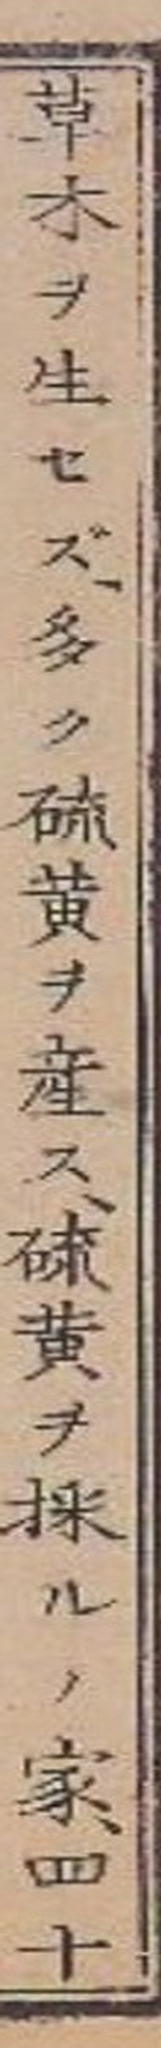草木ヲ生セズ、多ク硫黄ヲ産ス、硫黄ヲ採ルノ家、四十
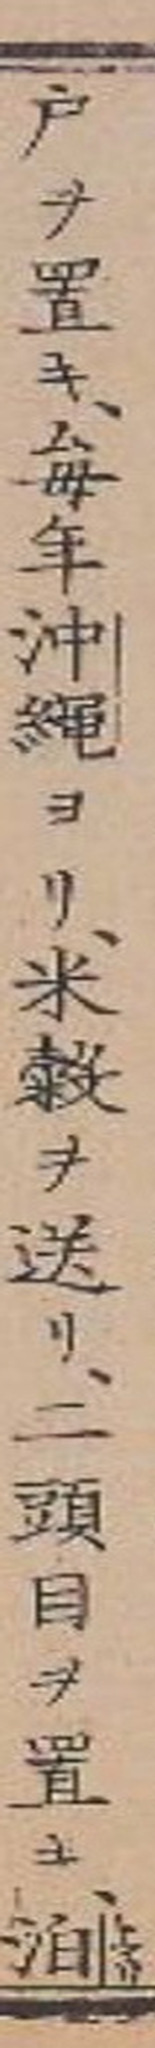戸ヲ置キ、毎年沖縄ヨリ、米穀ヲ送リ、二頭目ヲ置キ、泊
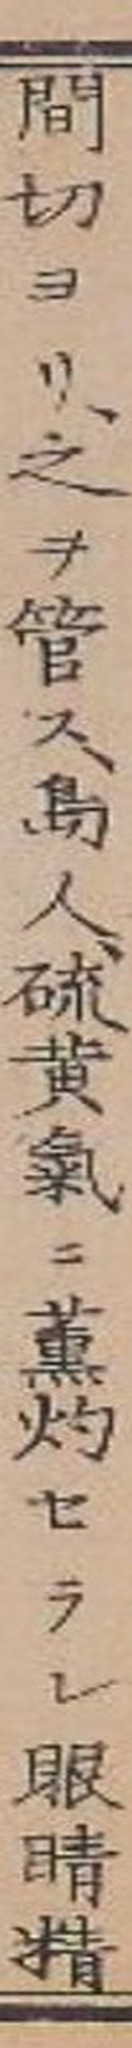間切ヨリ、之ヲ管ス、島人、硫黄気ニ薫灼セラレ眼晴精
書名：琉球新誌 巻上
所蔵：University of the Ryukyus Library
